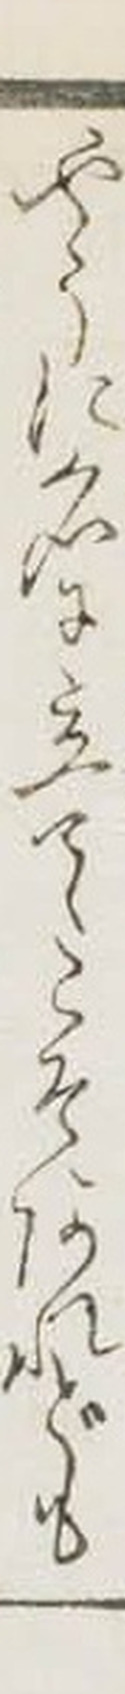やうに名に立てこそあれども
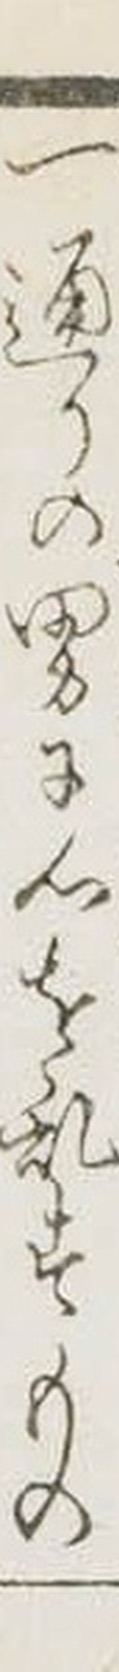一通りの男に心を乱すもの
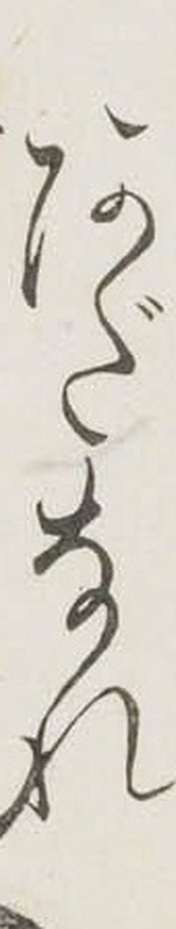あだなれ
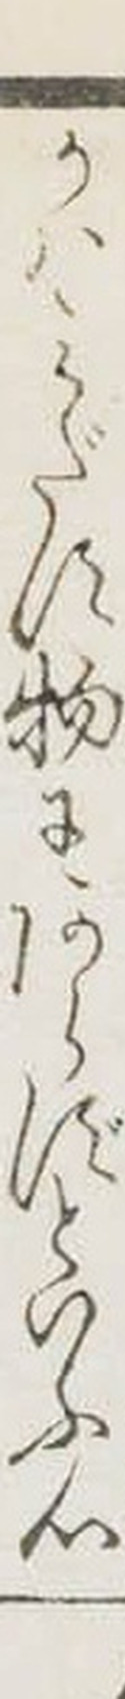かはみだす物にあらずといふ心
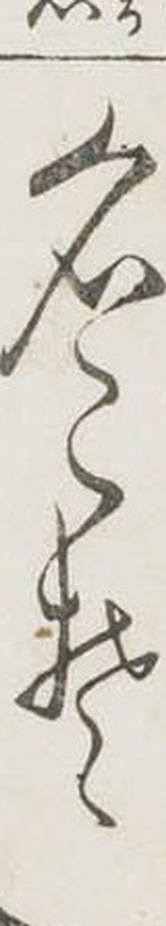名こそ
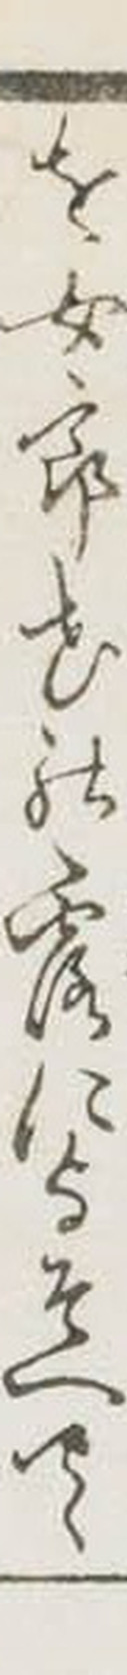を女郎花の露によそへて
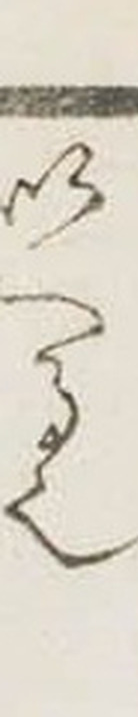いへる也
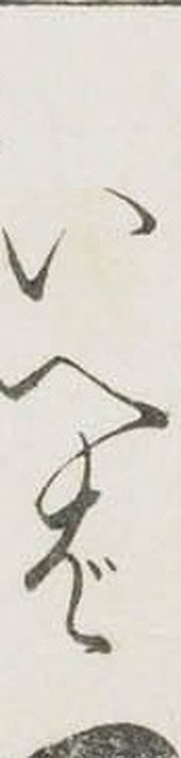いへば
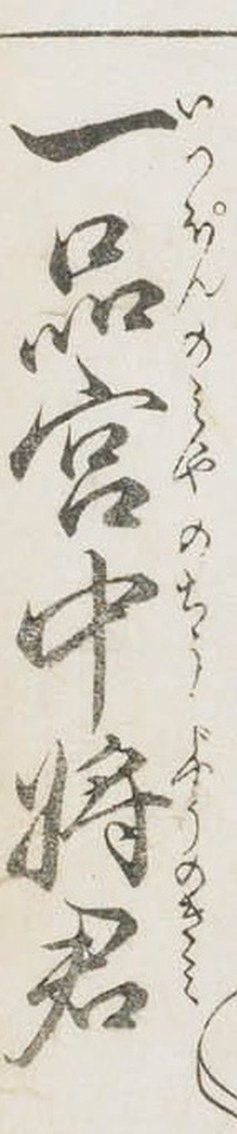一品宮中将君
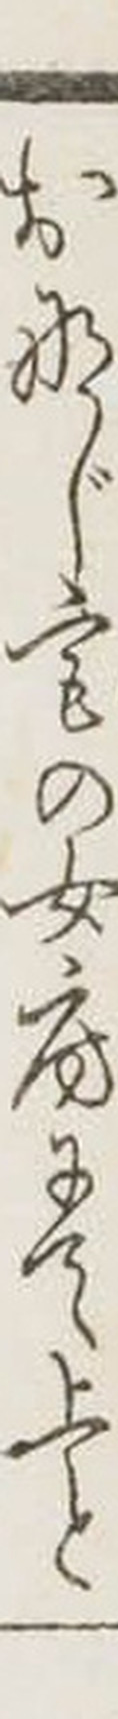おなじ宮の女房にて上と
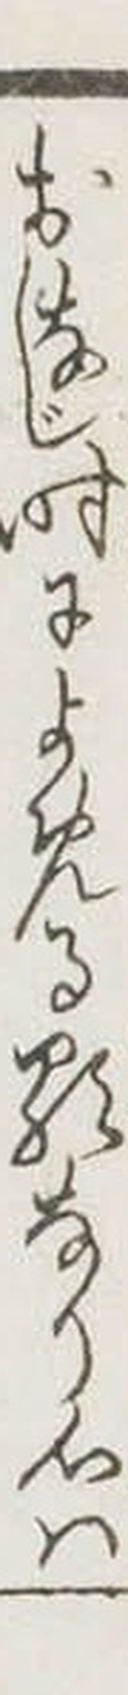おなじ時によめる歌なり心は
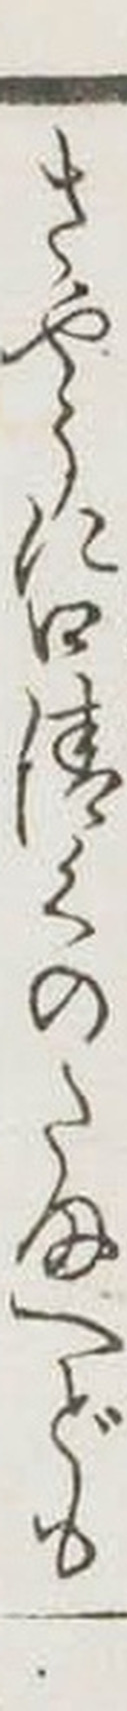さやうに口清くのたまへども
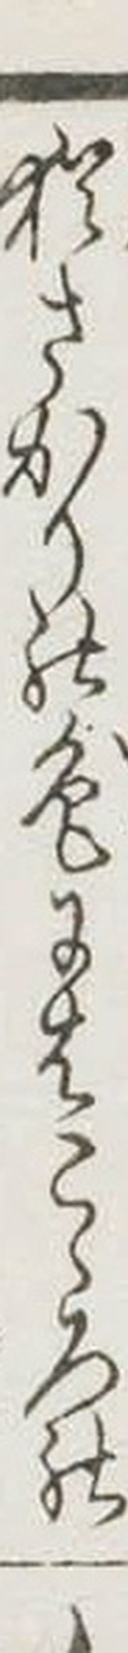猶さかりの色にはこゝろの
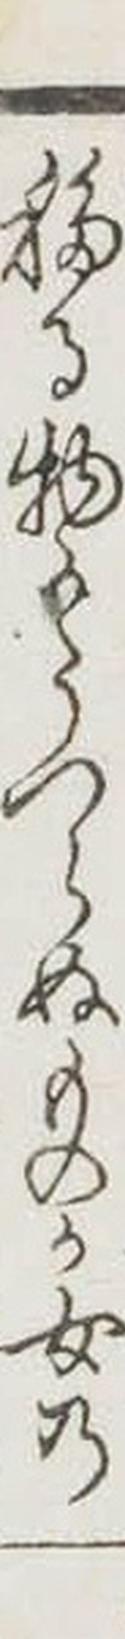移る物かうつらぬものか女の
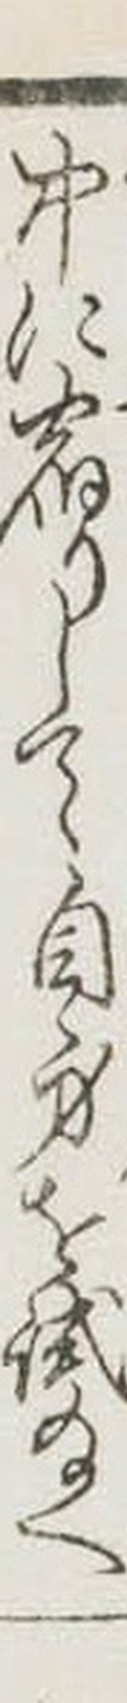中に宿りして自身を試給へ
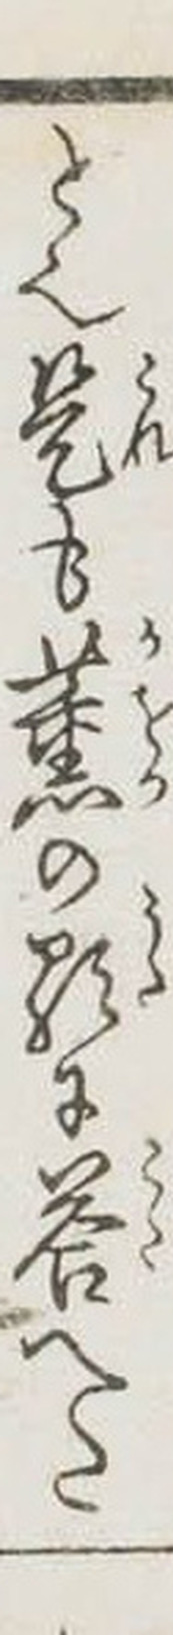と也是も薫の歌に答へた
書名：源氏百人一首
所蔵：東京学芸大学教育コンテンツアーカイブ
